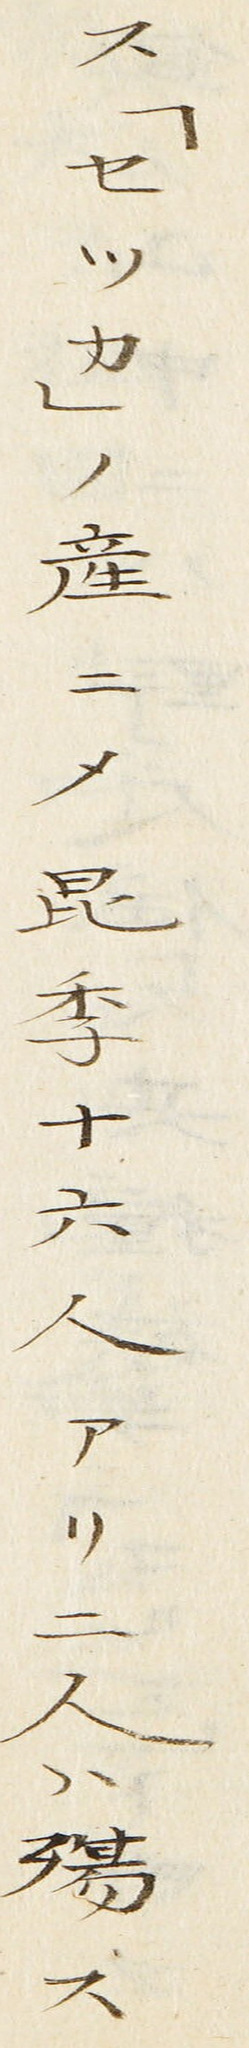ス「セツカ」ノ産ニシテ昆季十六人アリ二人ハ殤ス
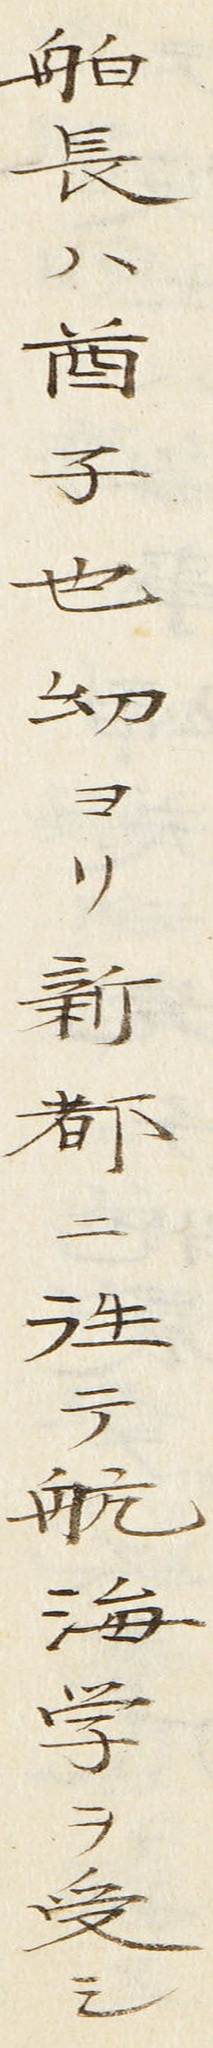舶長ハ酋子也幼ヨリ新都ニ往テ航海学ヲ受シ
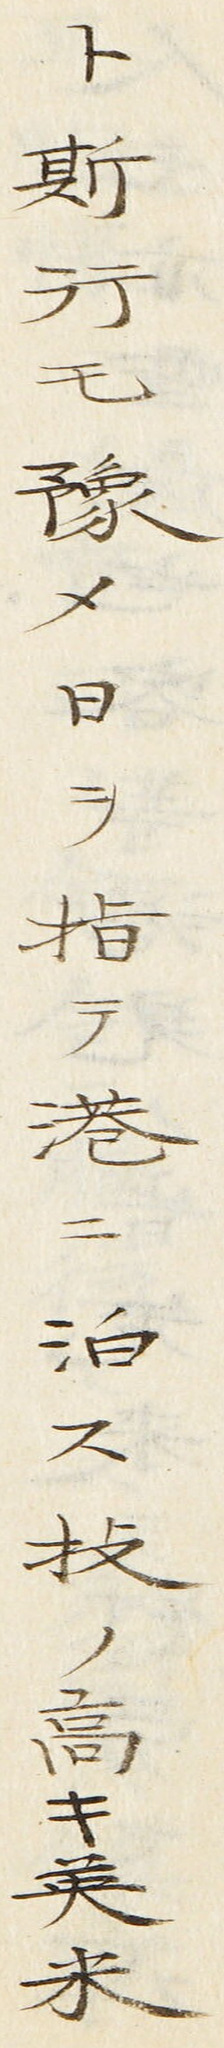ト斯行モ予メ日ヲ指テ港ニ泊ス技ノ高キ英米
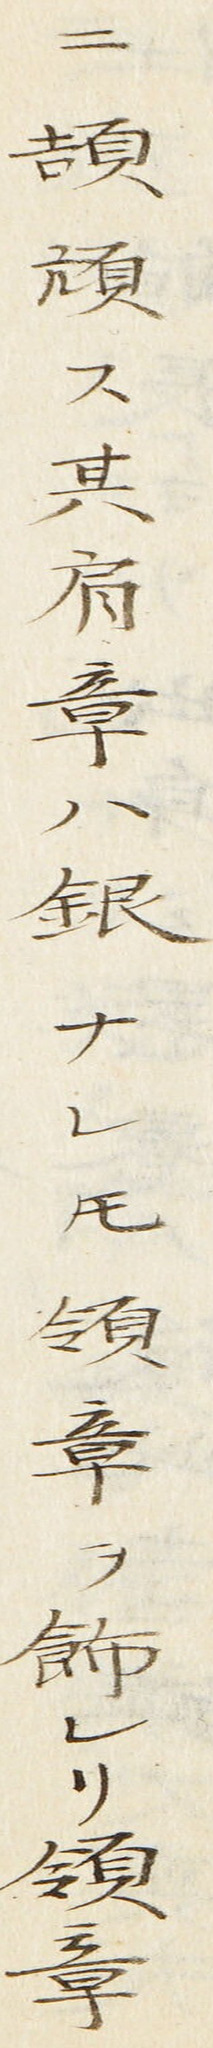ニ頡頑ス其肩章ハ銀ナレトモ領章ヲ飾レリ領章
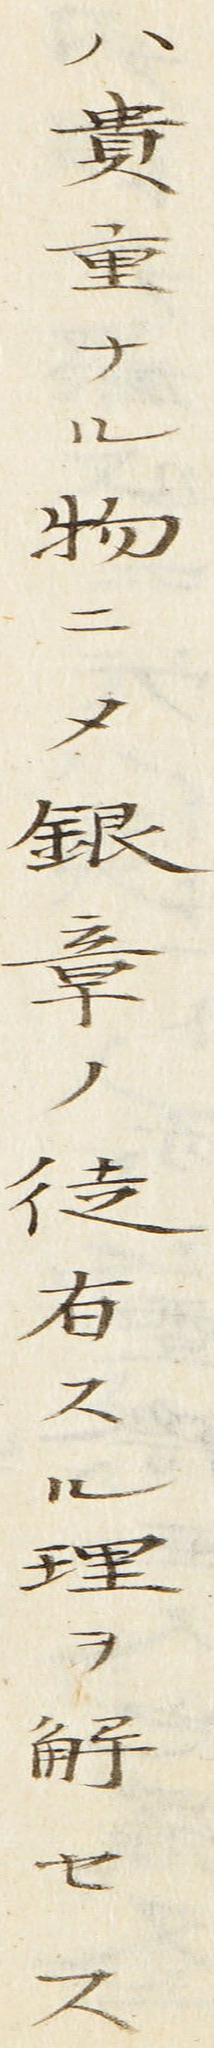ハ貴重ナル物ニシテ銀章ノ徒有スル理ヲ解セス
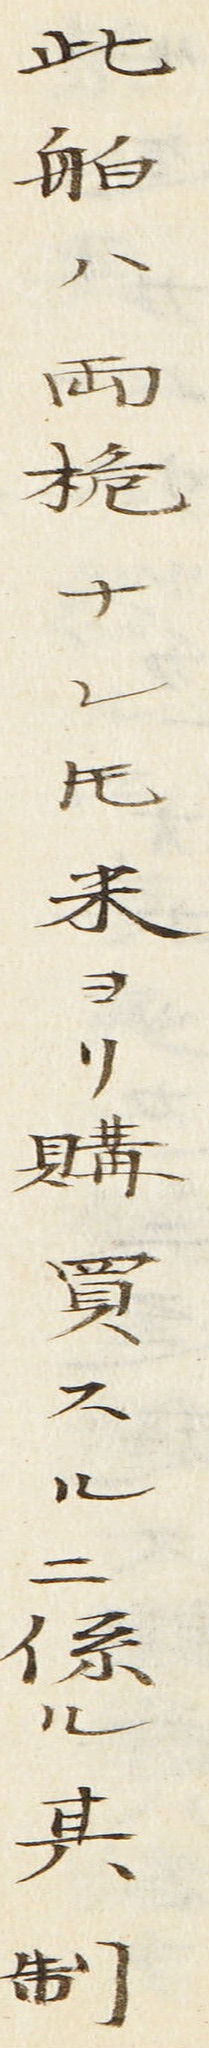此舶ハ両桅ナレトモ米ヨリ購買スルニ係ル其制
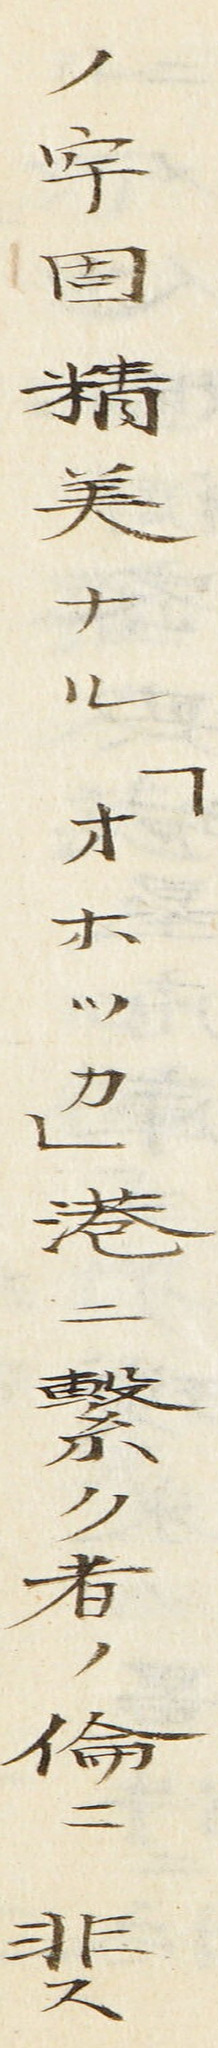ノ牢固精美ナル「オホツカ」港ニ繋ク者ノ倫ニ非ス
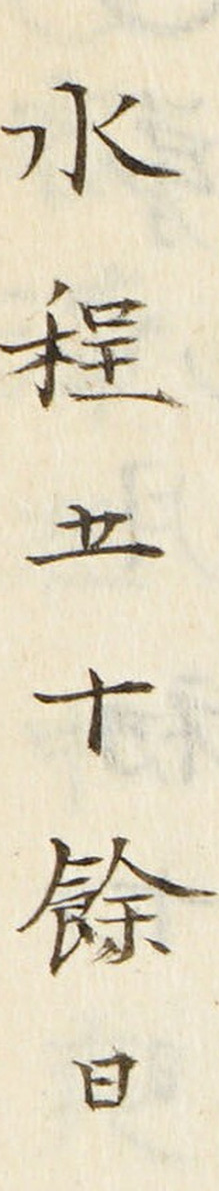水程五十余日

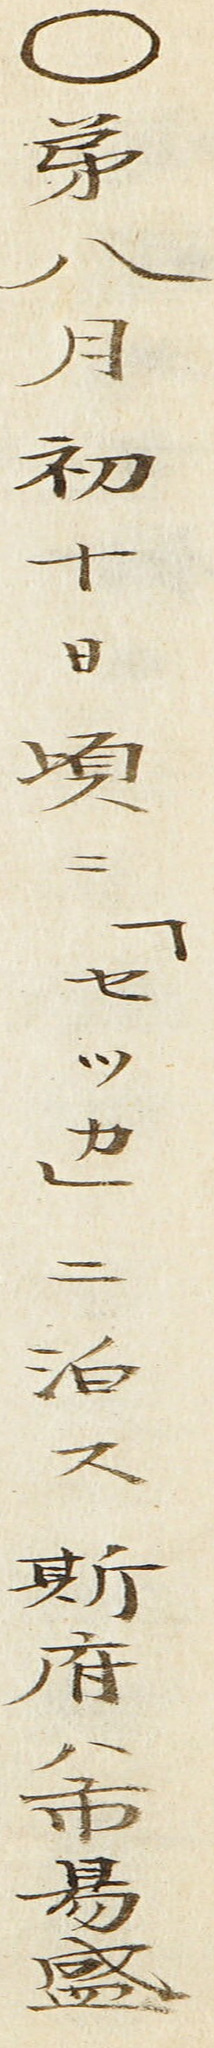○第八月初十日頃ニ「セツカ」ニ泊ス斯府ハ市昜盛
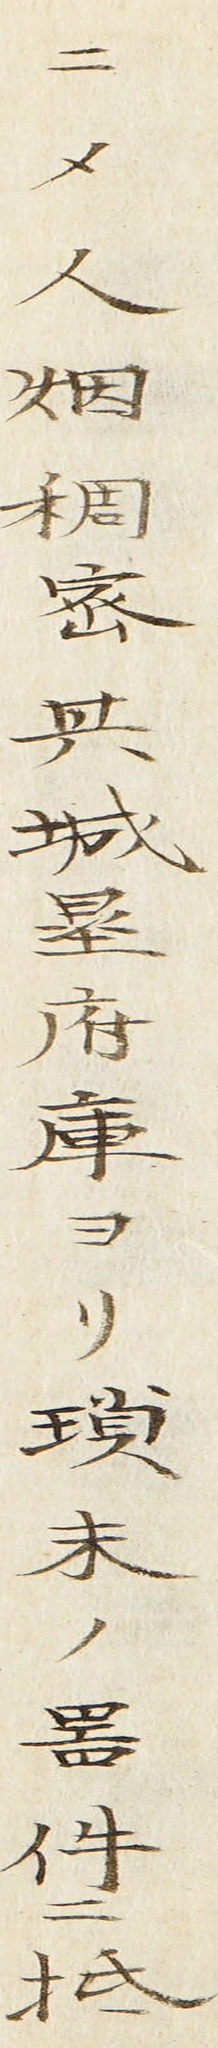ニシテ人烟稠密其城塁府庫ヨリ瑣末ノ器件二抵
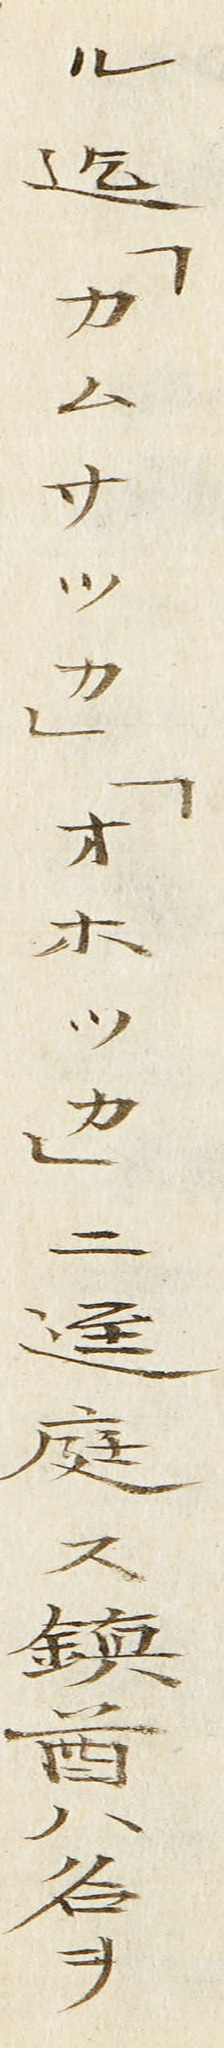ル迄「カムサツカ」「オホツカ」ニ𨒬庭ス鎮酋ハ名ヲ
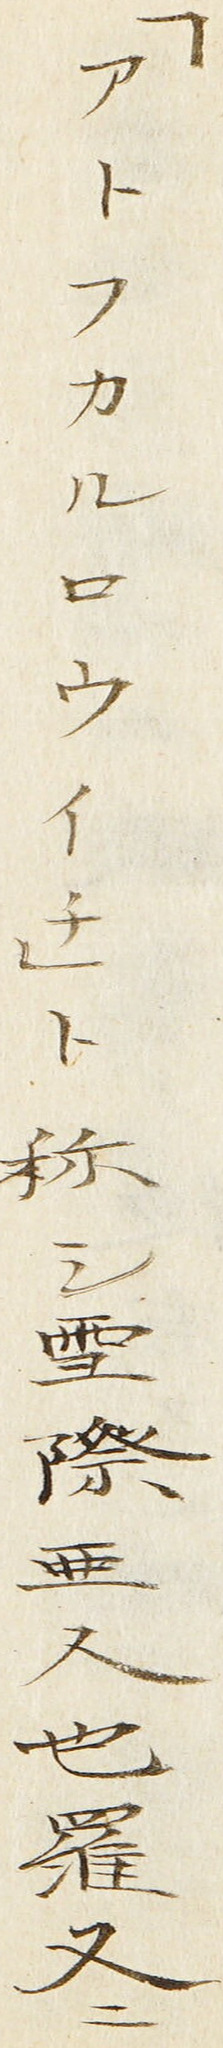「アトフカルロウイチ」ト称シ雪際亜人也羅又ニ
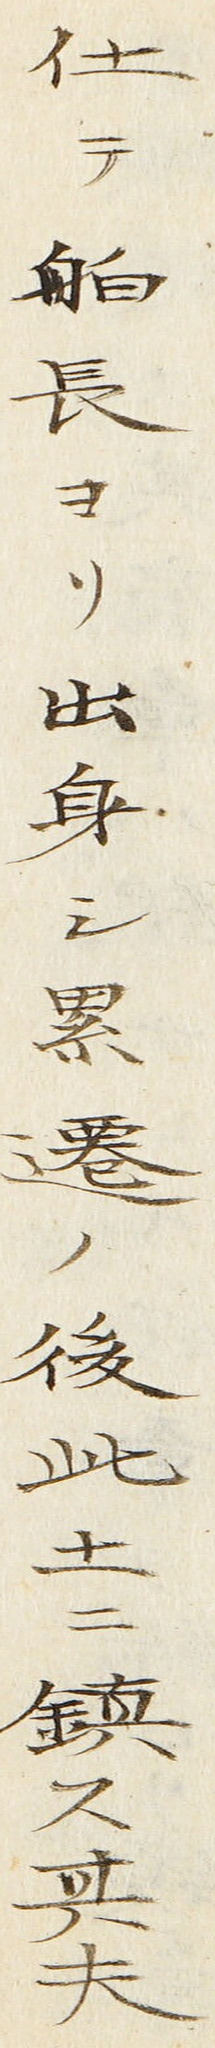仕テ舶長ヨリ出身シ累遷ノ後此土ニ鎮ス其夫
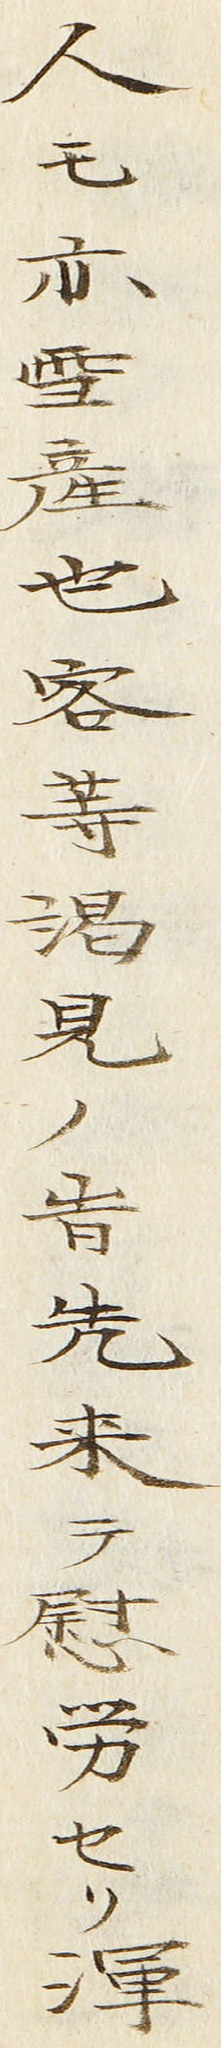人モ亦雪産也客等謁見ノ旹先来テ慰労セリ渾
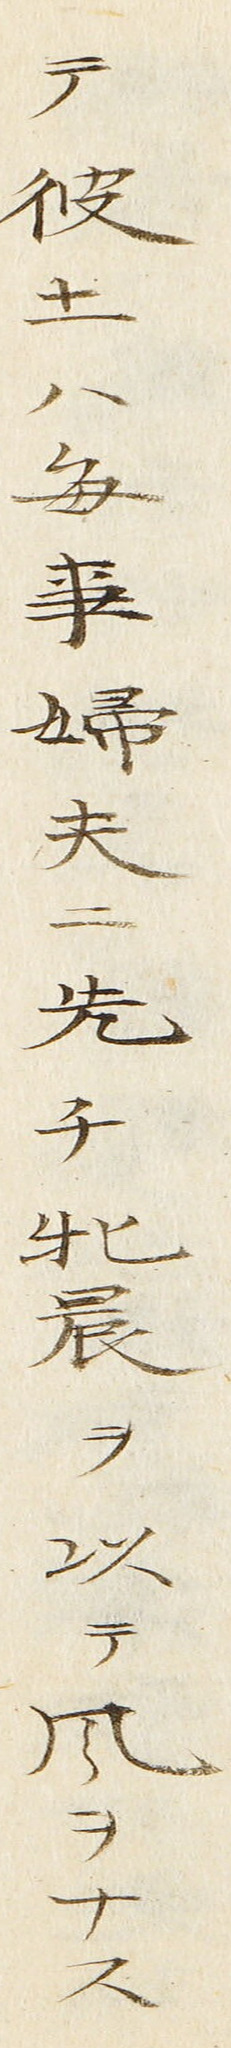テ彼土ハ毎事婦夫ニ先チ牝晨ヲ以テ風ヲナス
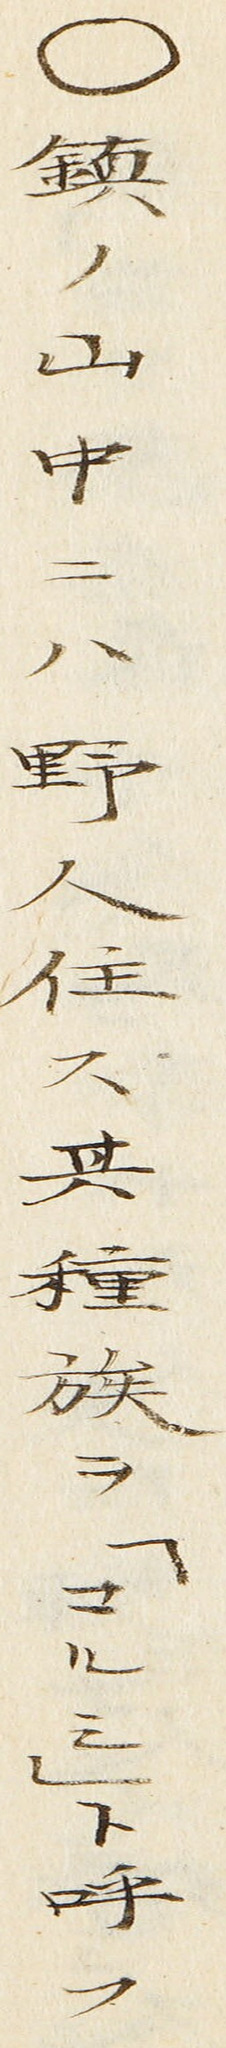○鎮ノ山中ニハ野人住ス其種族ヲ「コルシ」ト呼フ
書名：流蕃通書
